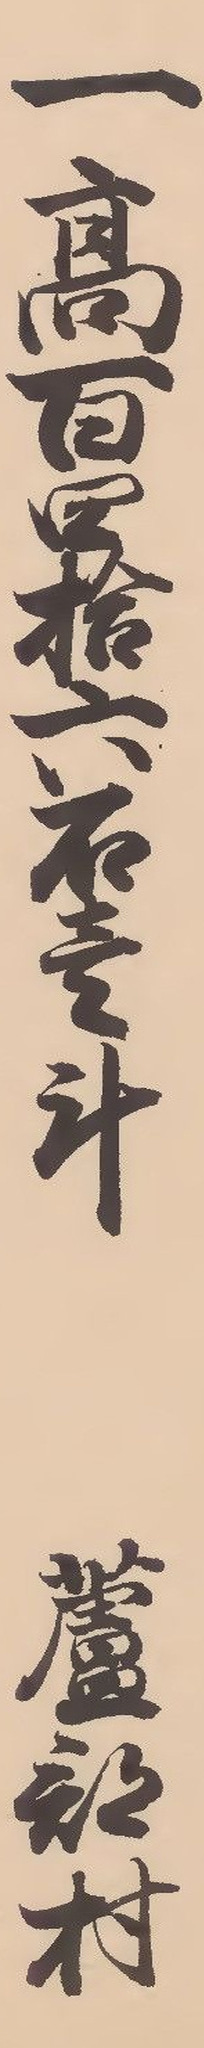一高百四拾六石壱斗芦部村
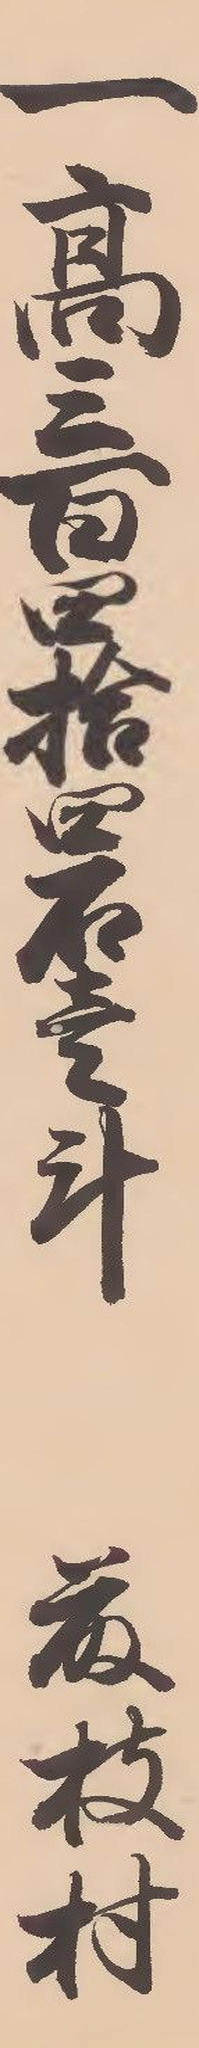一高三百四拾四石壱斗藤枝村
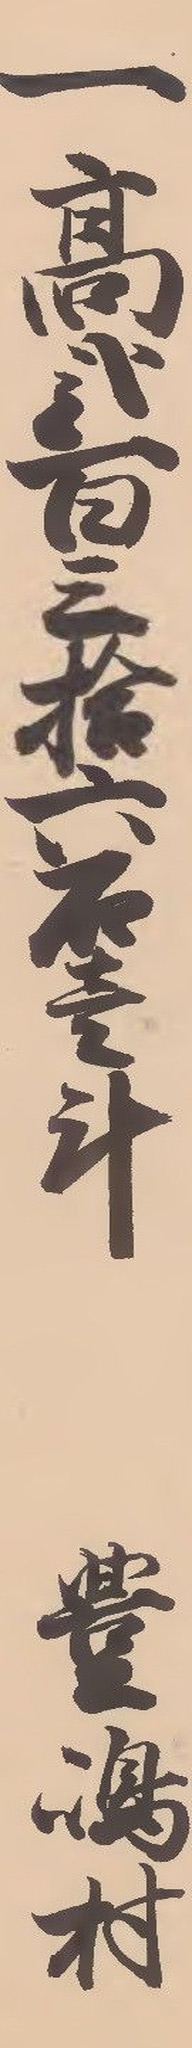一高二百三拾六石壱斗豊嶋村
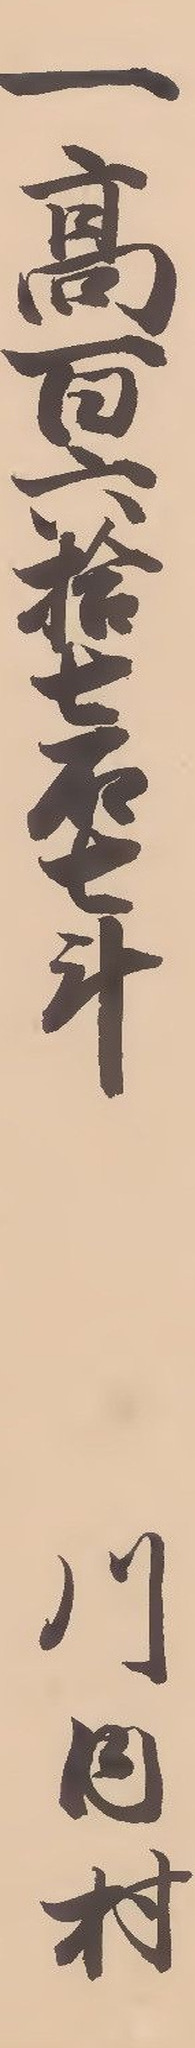一高百六拾七石七斗川内村
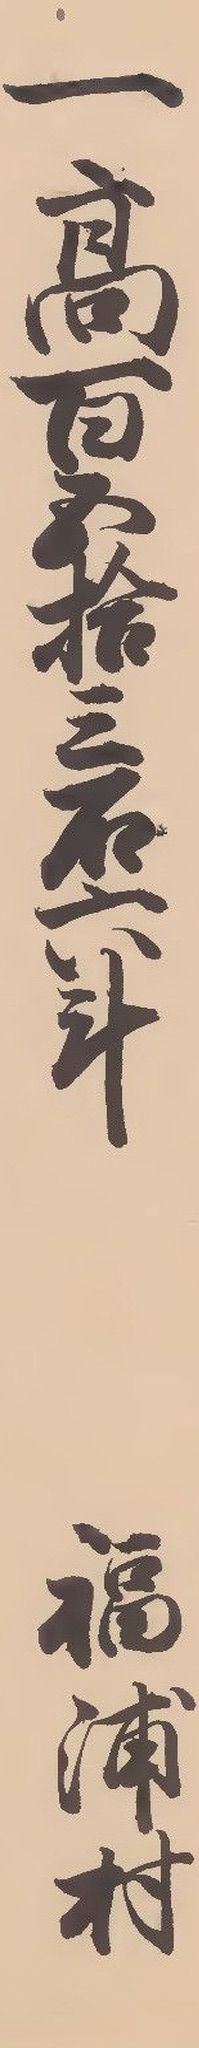一高百五拾三石六斗福浦村
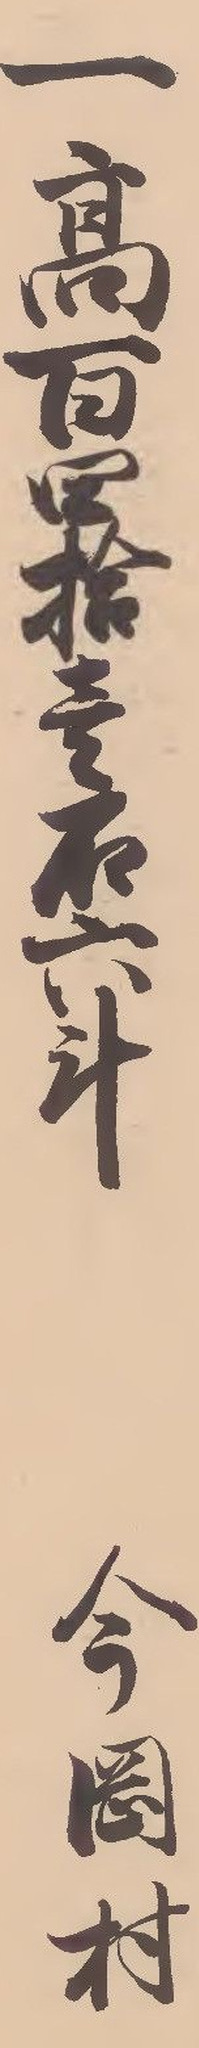一高百四拾壱石六斗今岡村

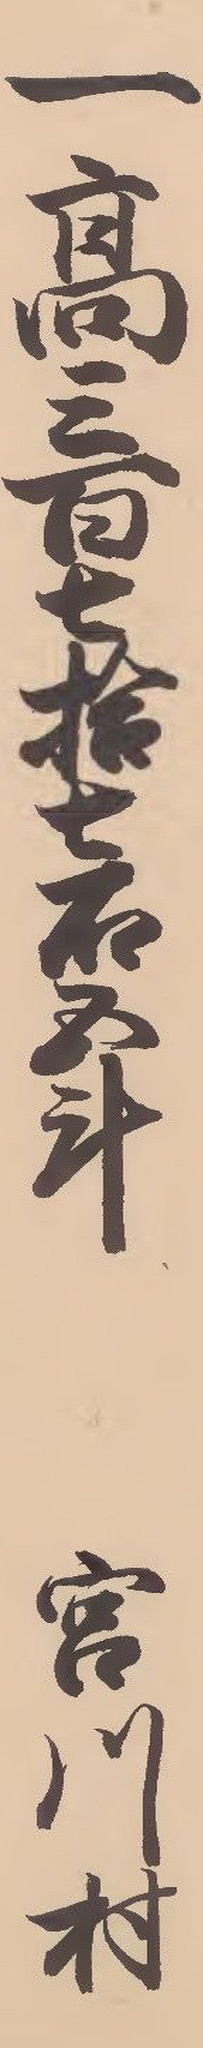一高三百七拾七石五斗宮川村
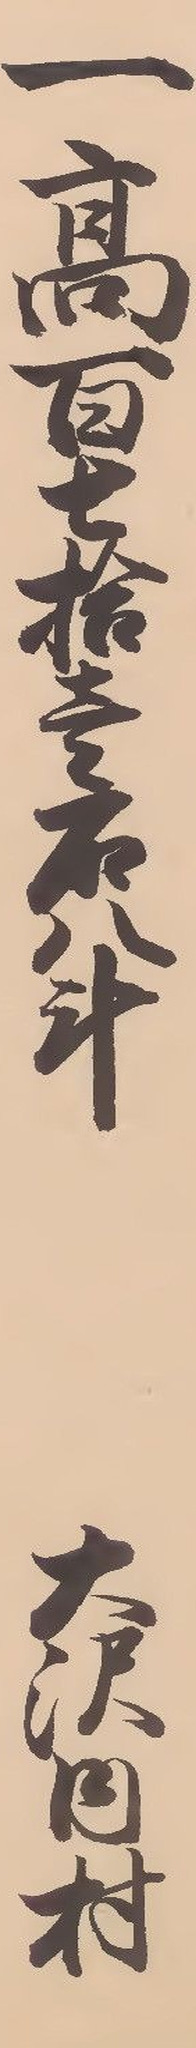一高百七拾壱石八斗大沢内村
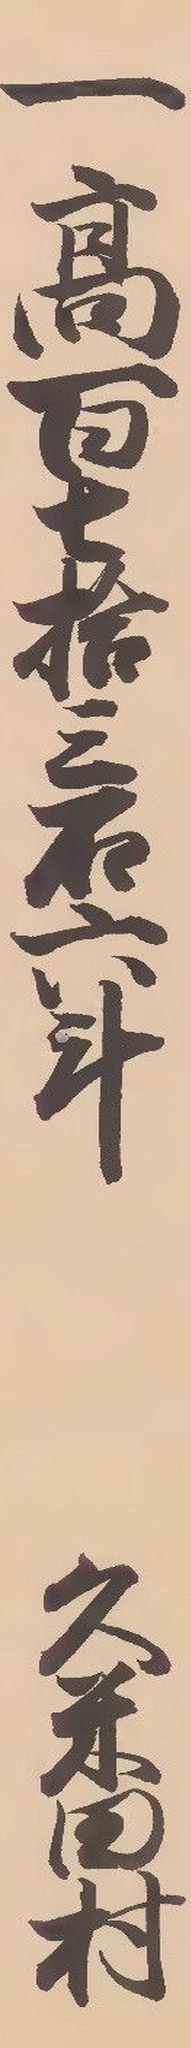一高百七拾三石六斗久米田村
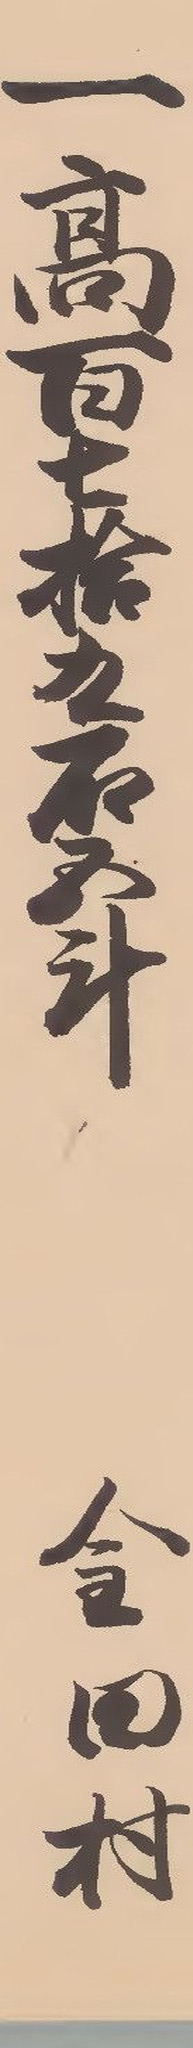一高百七拾九石五斗金田村
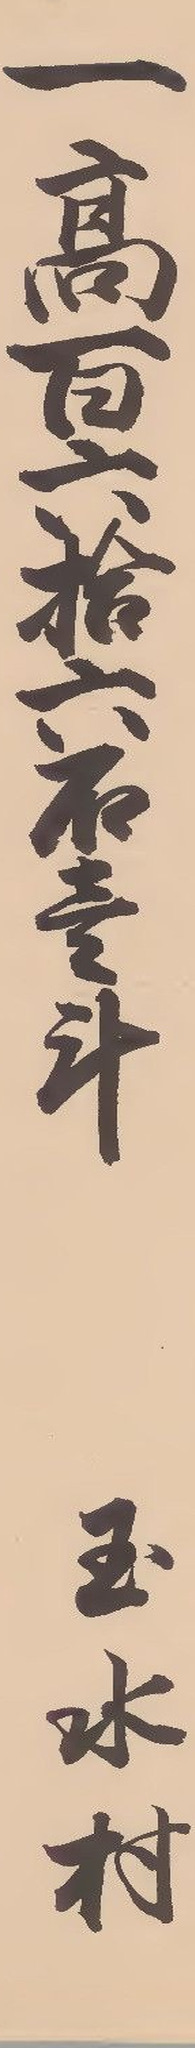一高百六拾六石壱斗玉水村

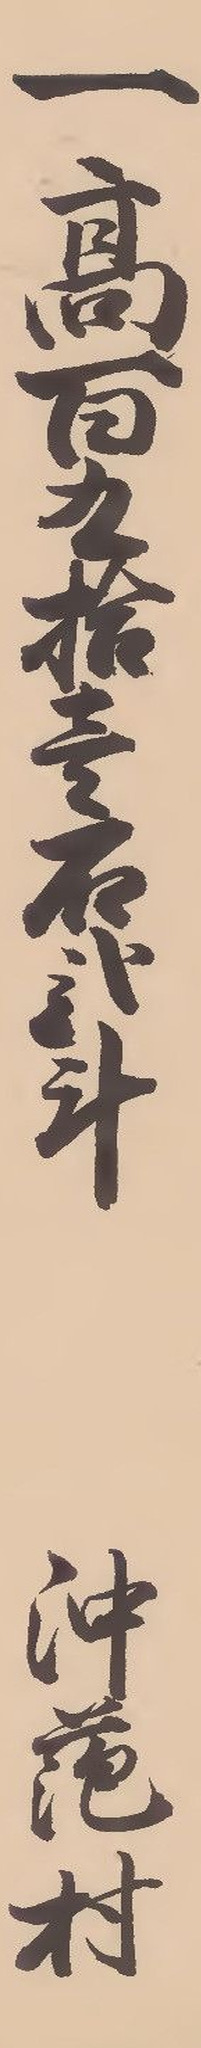一高百九拾壱石弐斗沖萢村
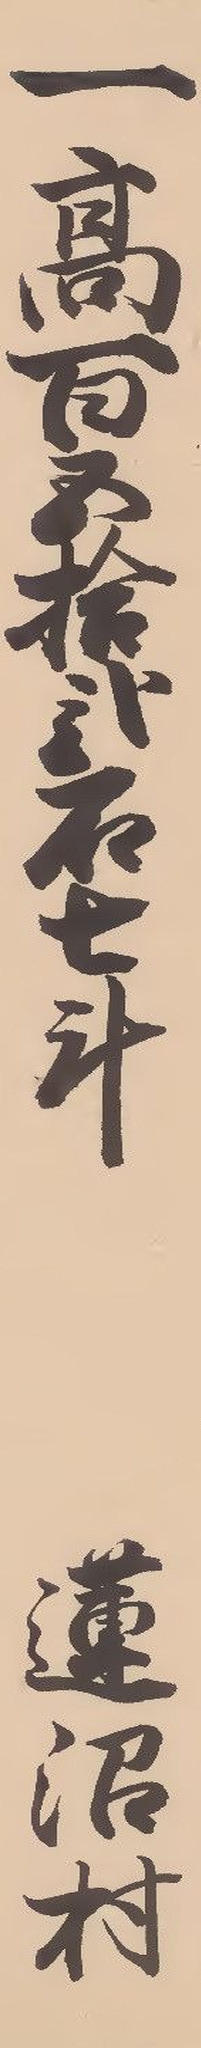一高百五拾弐石七斗蓮沼村
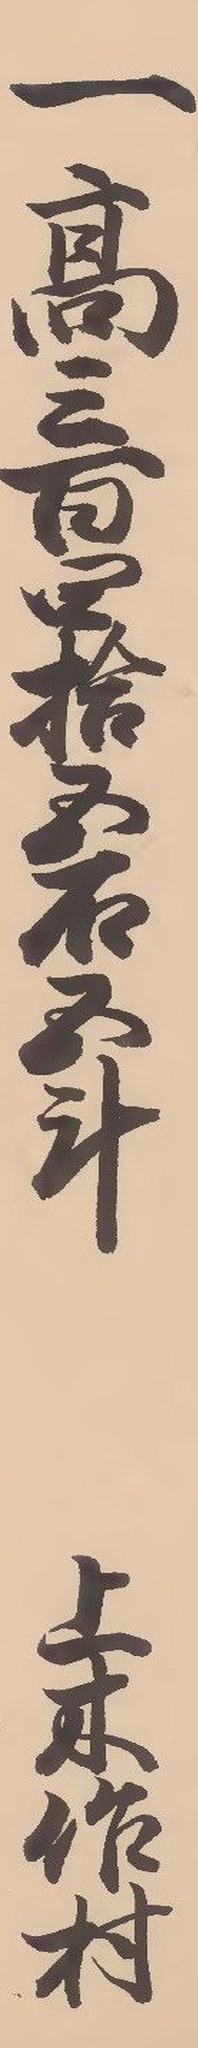一高三百四拾五石五斗上木作村
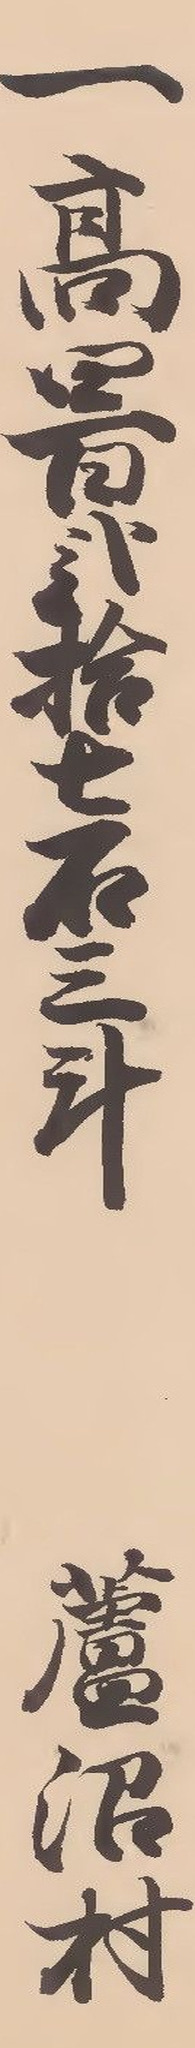一高四百弐拾七石三斗芦沼村
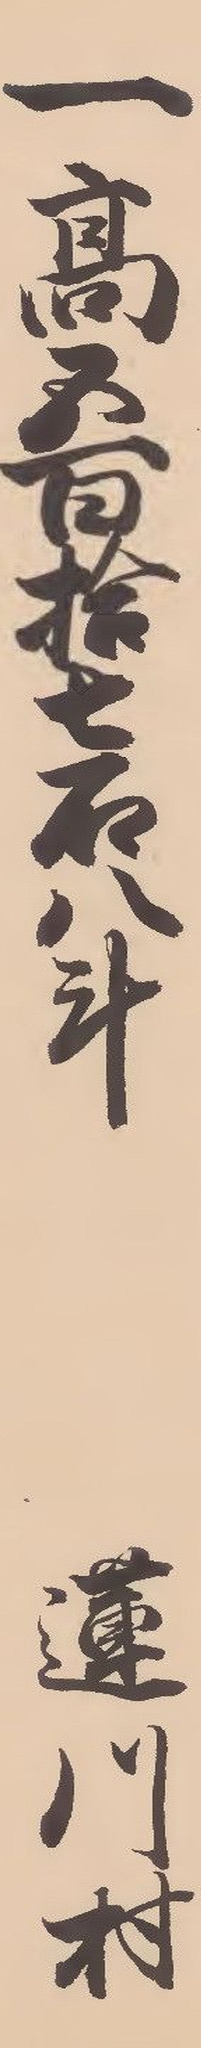一高五百拾七石八斗蓮川村
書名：陸奥国郷帳　７
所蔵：国立公文書館 National Archives of Japan
